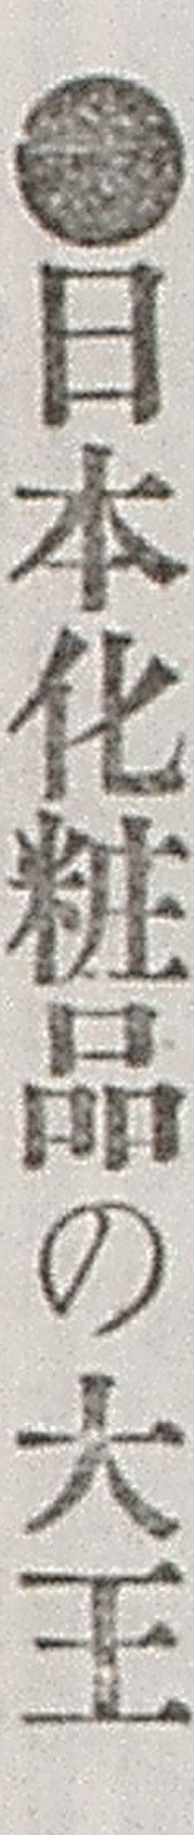●日本化粧品の大王
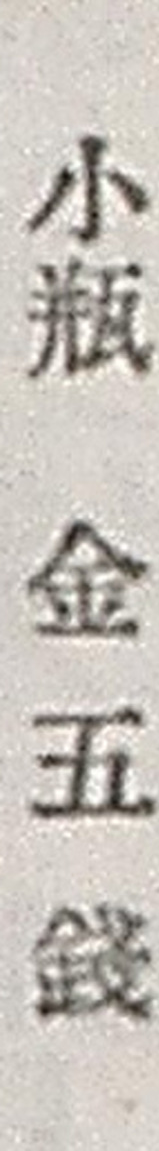小瓶金五銭
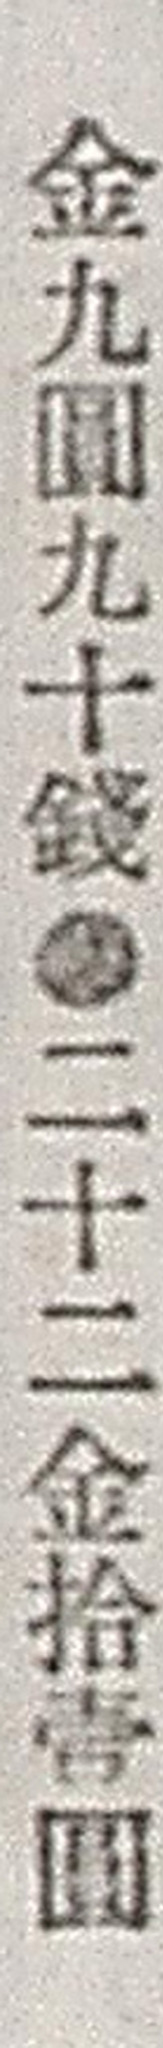金九円九十銭●二十二金拾一円
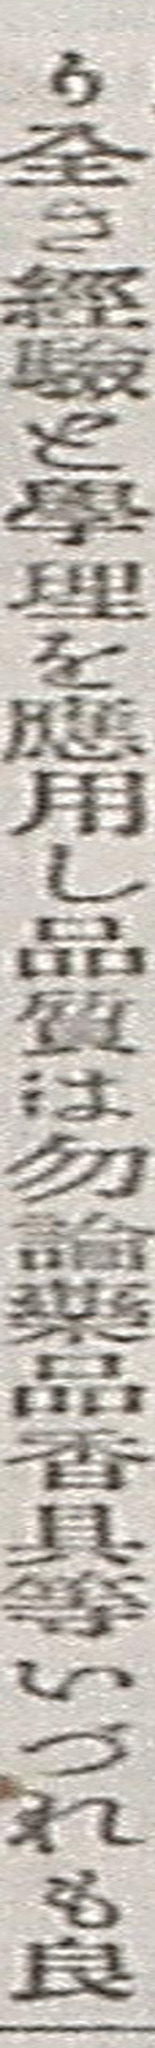り全き経験と学理を応用し品質は勿論薬品香具等いづれも良
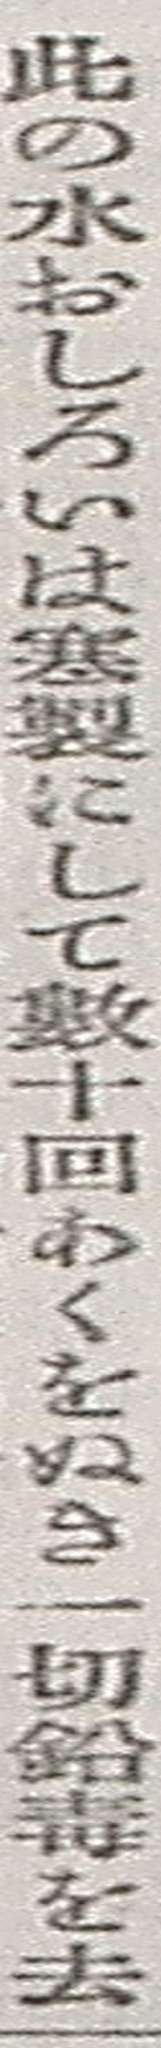此の水おしろいは寒製にして数十回あくぬき一切鉛毒を去
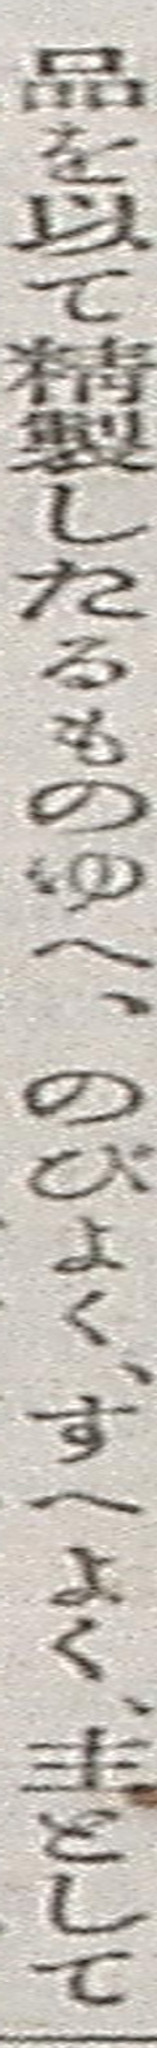品を以て精製したるものゆへ、のびよく、すへよく、主として
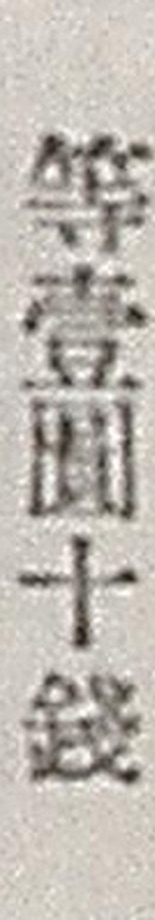等一円十銭
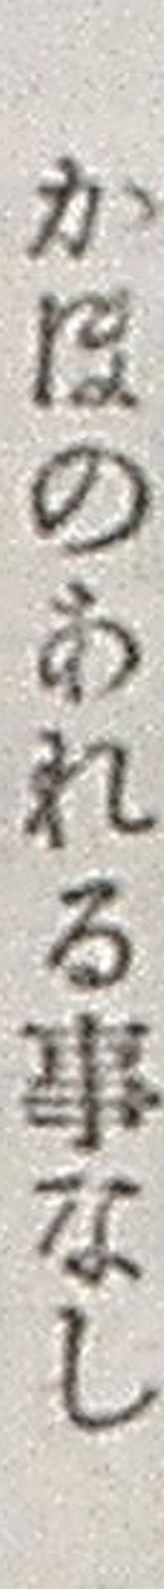かほのあれる事なし
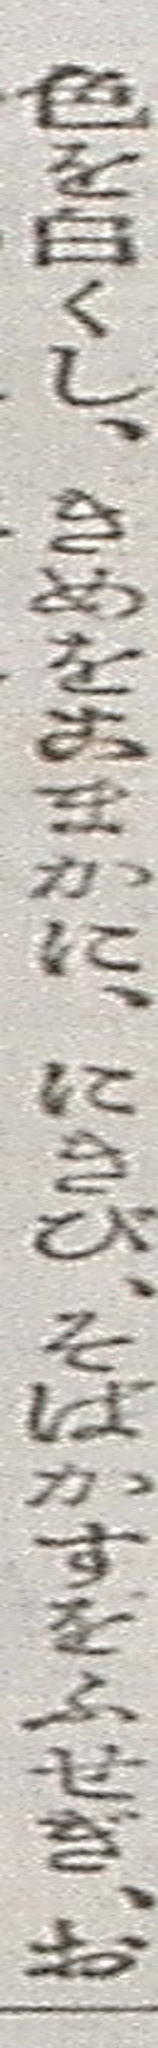色を白くし、きめこまかに、にきび、そばかすをふせぎ、お
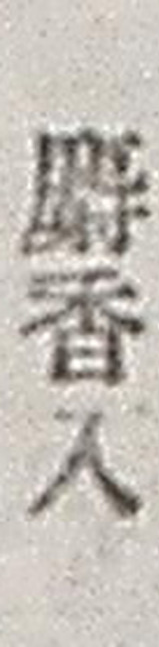麝香入
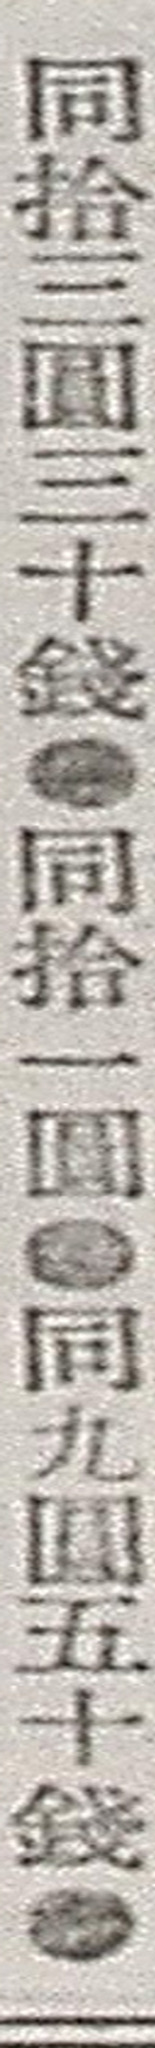同拾三円三十銭●同拾一円●同九円五十銭●
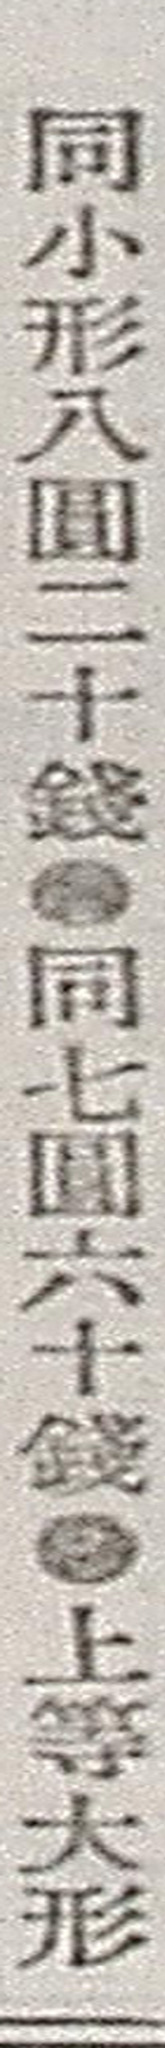同小形八円二十銭●同七円六十銭●上等大形
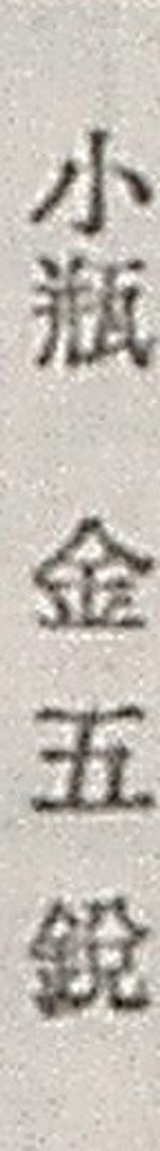小瓶金五銭
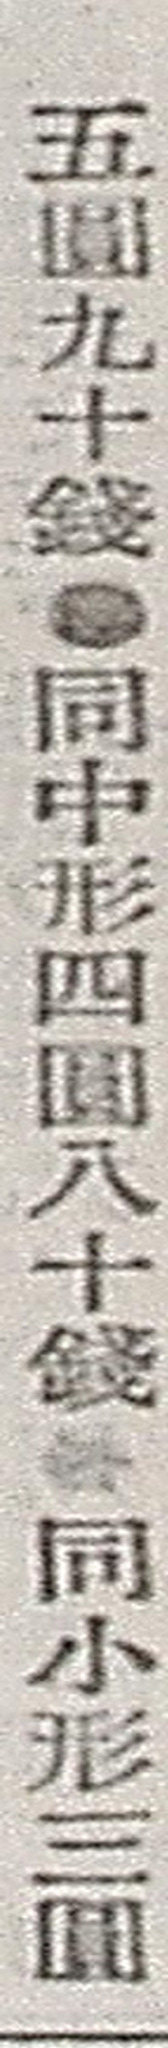五円九十銭●同中形四円八十銭●同小形三円
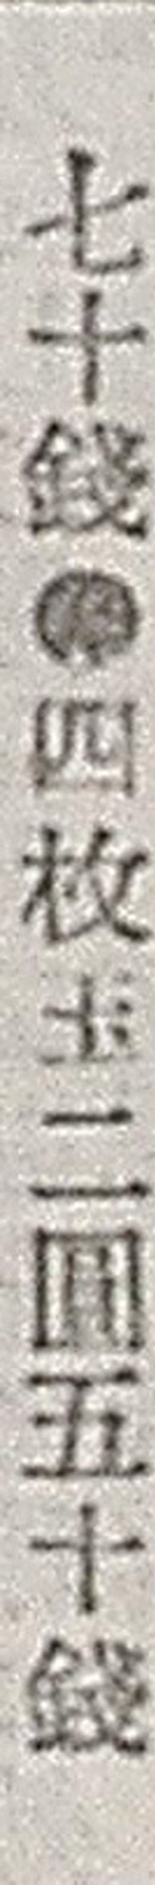七十銭●四枚玉二円五十銭
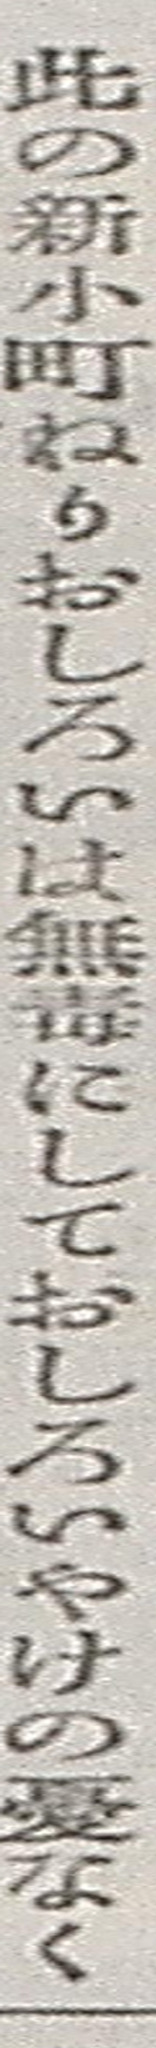此の新小町ねりおしろいは無毒にしておしろいやけの憂なく
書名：風俗畫報臨時増刊第百二十號　大海嘯被害録（下）
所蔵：東京大学地震研究所図書室 Earthquake Research Institute Library, The University of Tokyo, JAPAN
